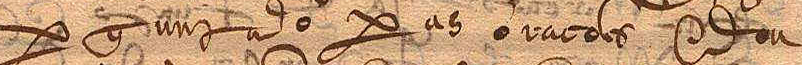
ꝑguntado ꝑ as oracões e dou
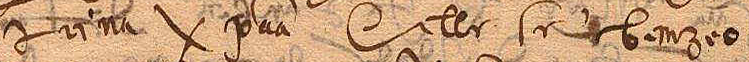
trina Xpāa e elle se bemzeo
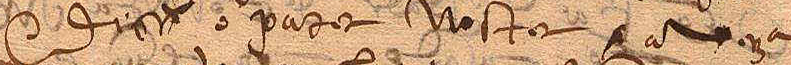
e dise o pater noster e ave ma
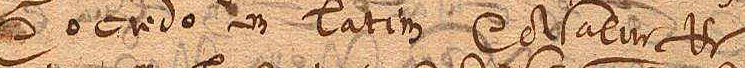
e o credo em latim e A salue Re
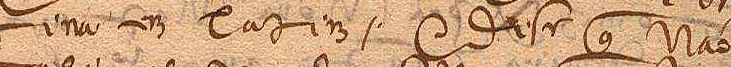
gina em latim /. e dise q̄ naõ
